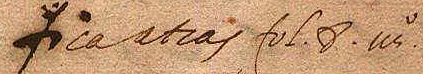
fica atras fol.8. uso.
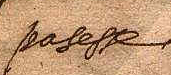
pasesse
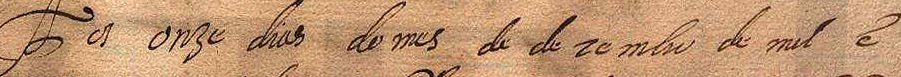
Aos onze dias do mes de dezembro de mil e
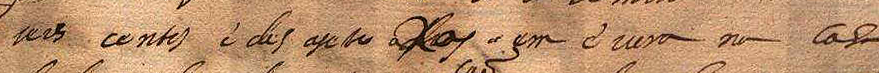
seiscentos e desasete _ em euora na casa
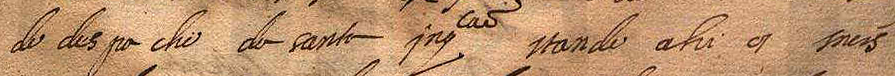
do despacho da santa jnqção stando ahi os snor̄s
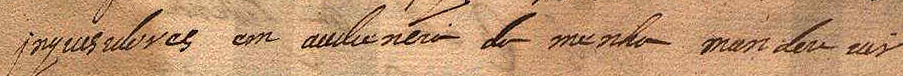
jnquisidores em audiencia da menha mandou uir
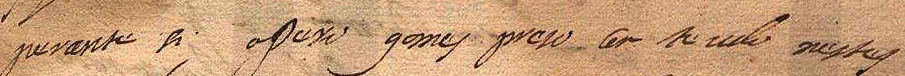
perante si a pero gomes prezo conteudo nestes
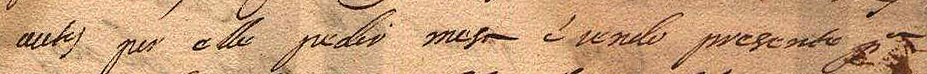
autos per elle pedir mesa e sendo presente pa
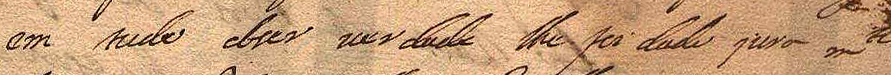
em tudo diser uerdade lhe foi dado juramto
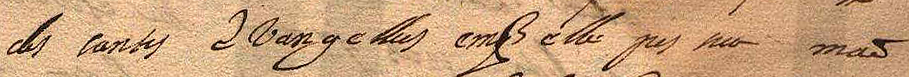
dos santos evangelhos em q̄ elle pos sua maõ
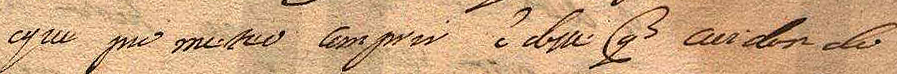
e que prometeo comprir e disse q̄ cuidando
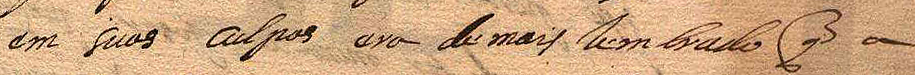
em suas culpas era de mais lembrado q̄ a
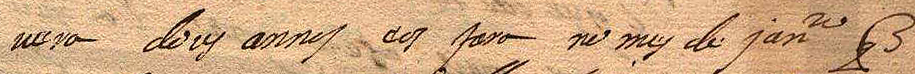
uera dous annos e os fara no mes de janro q̄
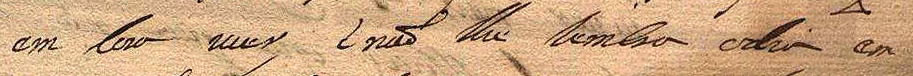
embora uier e não lhe lembra o dia em
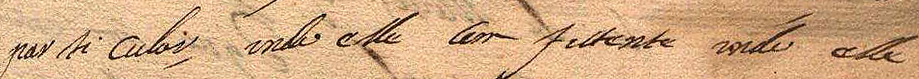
particular, indo elle comfittente indo elle
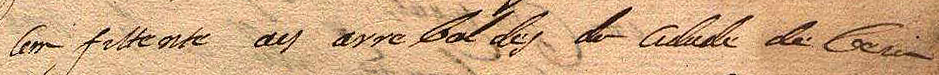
comfittente aos arrebaldes da cidade de beia
